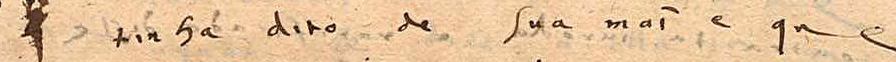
tinha dito de sua mai̅ e que
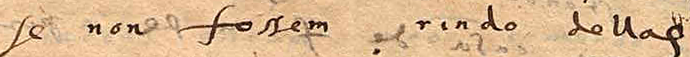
se non fossem rindo dellas
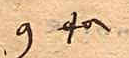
9 ta
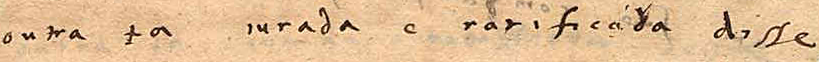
outra ta iurada e ratificada disse
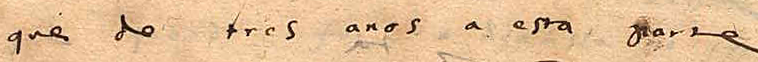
que de tres anos a esta parte
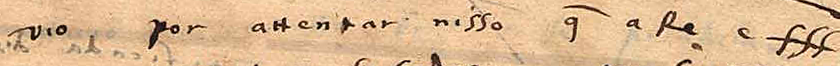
vio por attentar nisso q̅ a Re e fff
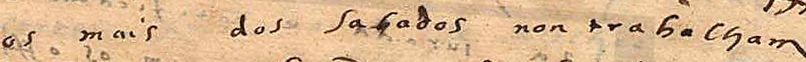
os mais dos sabados non trabalham
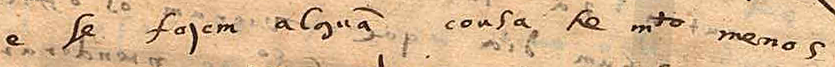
e se fazem alguā cousa he mto menos
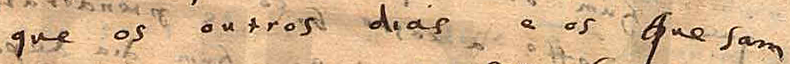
que os outros dias e os que sam
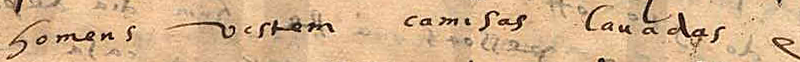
homens vestem camisas lauadas e
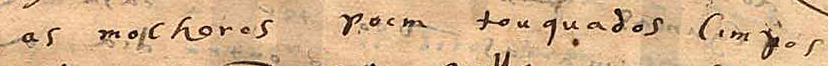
as molheres poem touquados limpos
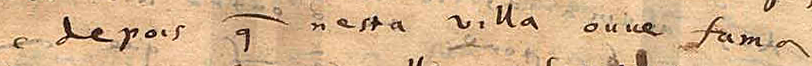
e depois q̅ nesta villa ouue fama
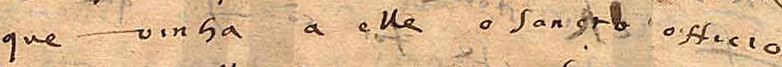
que vinha a elle o sancto officio
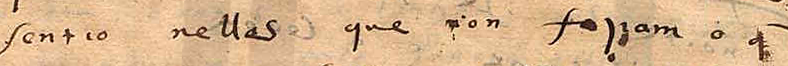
sentio nellas que non faziam o q̅
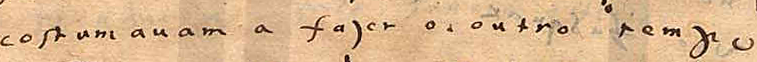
costumauam a fazer o outro tempo
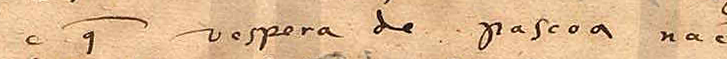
e q̅ vespera de pascoa naõ
